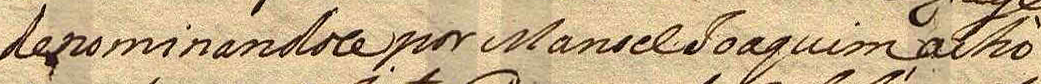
denominandoce por Manoel Ioaquim, acho
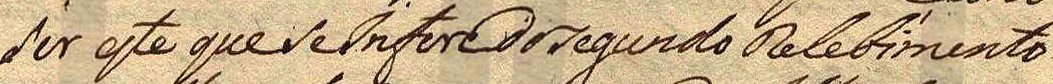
ser este que se Infere do segundo Recebimento
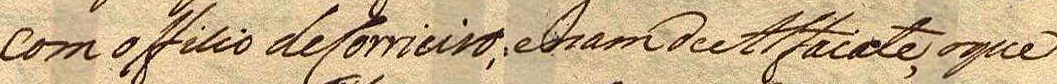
com officio de Corrieiro, e nam de Alfaiate, o que
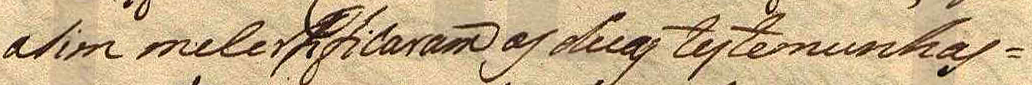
asim me Certificaram as duas testemunhas
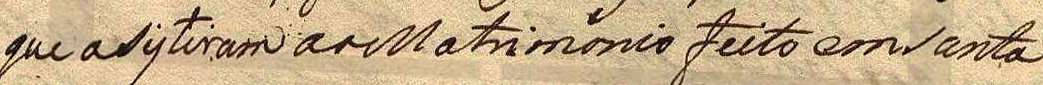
que asistiram ao Matrimonio feito em santa
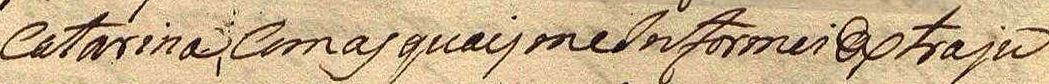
Catarina, com as quais me Ingormei Extraju
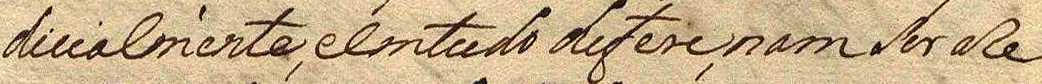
dicioalmente, e em tudo difere, nam ser a Re
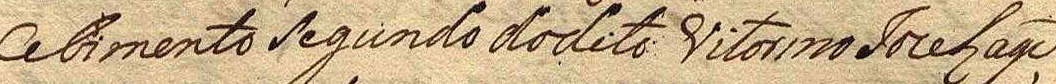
cebimento segundo do dito Vitorino Ioze Lage,
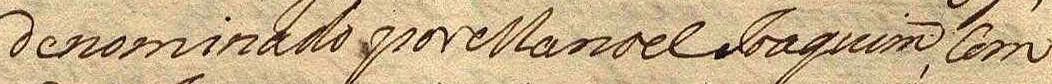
de nominado por Manoel Ioaquim, com
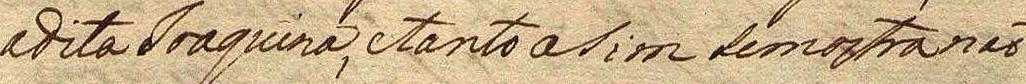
a dita Ioaquina, e tanto asim demostra naõ
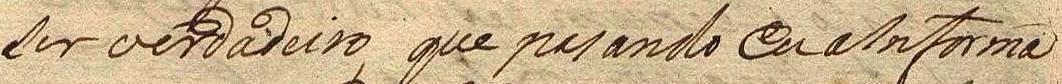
ser verdadeiro, que pasando eu a Informa
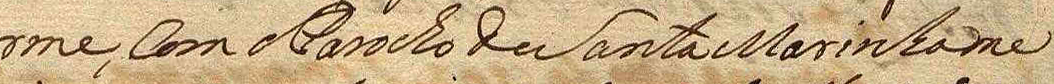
rme, com o Parocho da Santa Marinha me
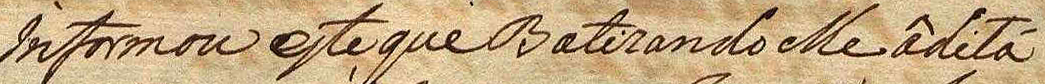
Informou este, que Batizando elle á ditá
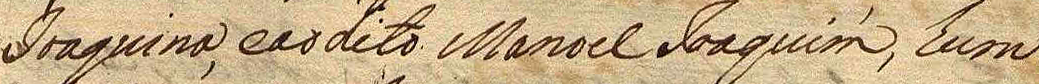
Ioaquina, e ao dito Manoel Ioaquim, hum
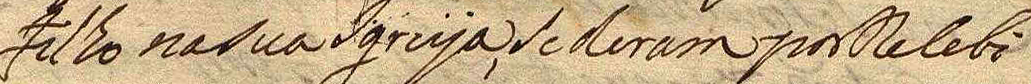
filho na sua Igreja, se deram por Recebi
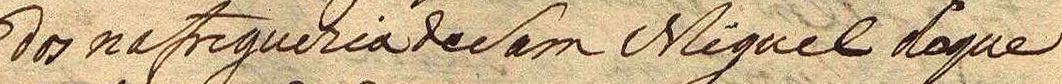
dos na freguezia de Sam Miguel do que
